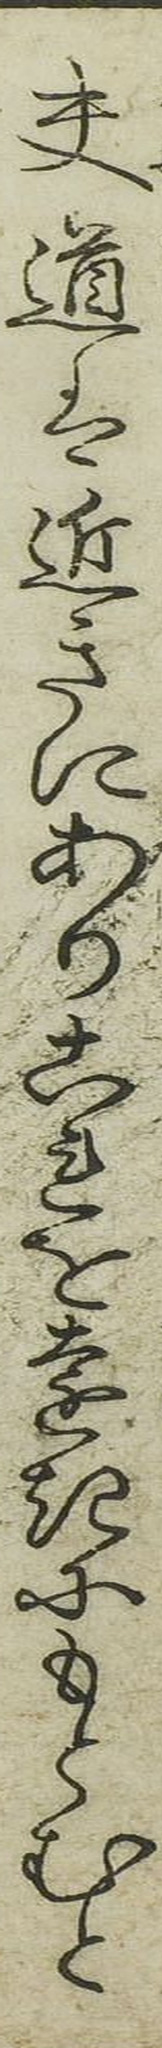夫道は近きにありこれを遠きにもとむと
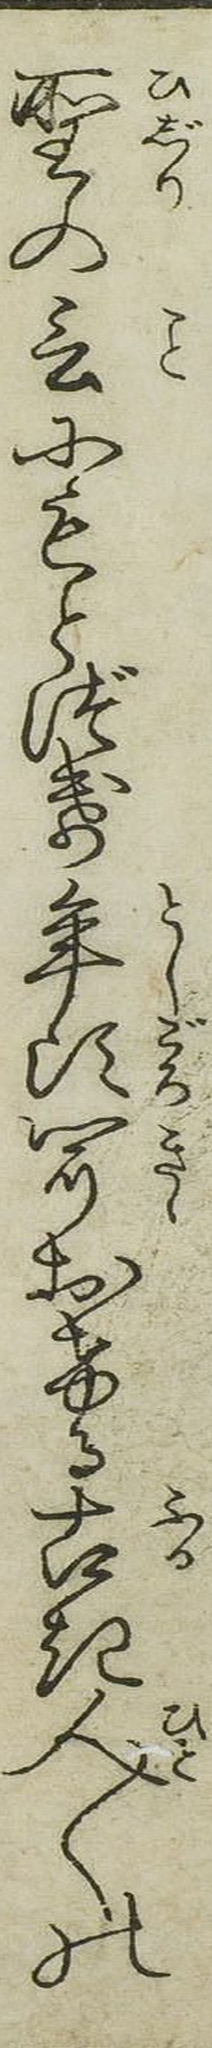聖の言にもとづき年頃聞おける古き人〳〵の
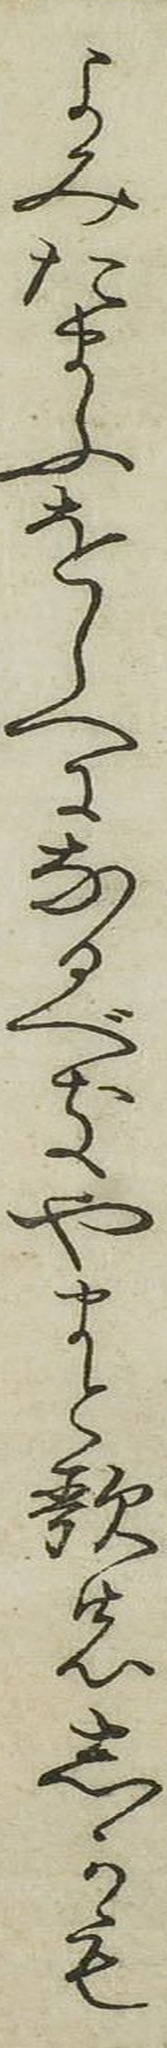よみたまふをしへになるべきやまと歌のしかも
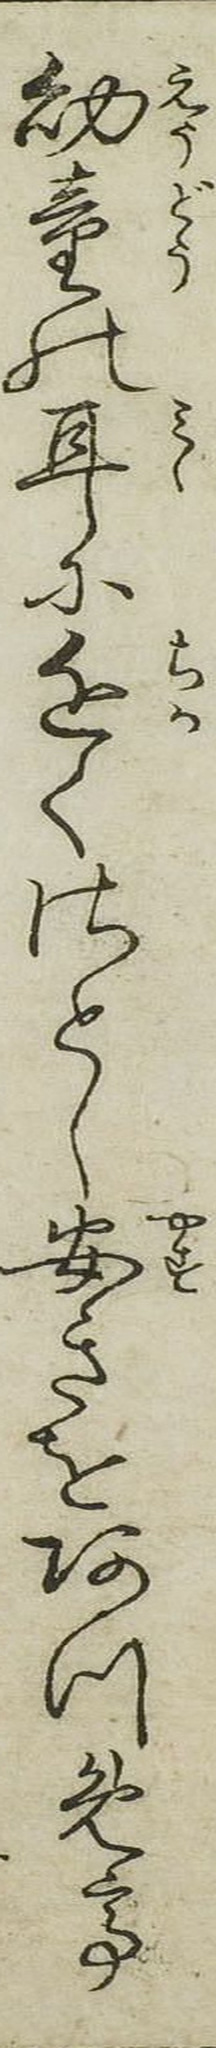幼童の耳に近くさとし安きをあつめて
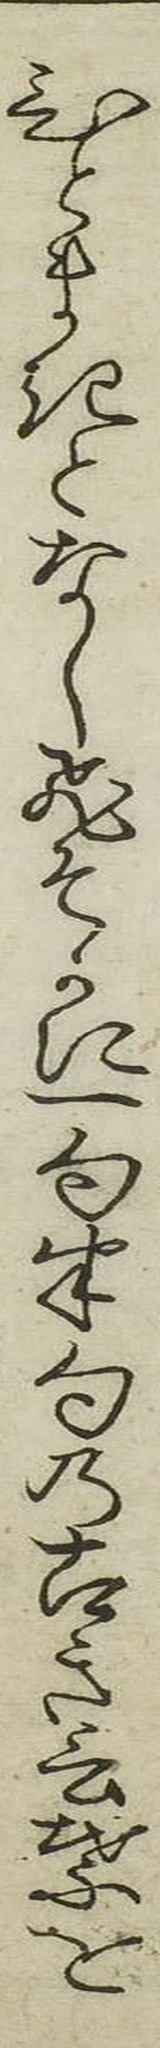ひとまきとなしひそかに一句半句の古き言葉を
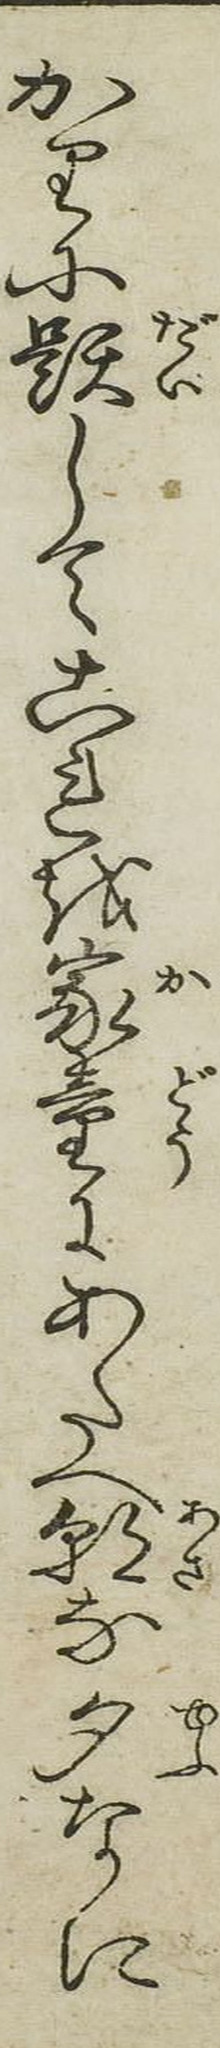かりに題してこれを家童にあたへ朝な夕なに
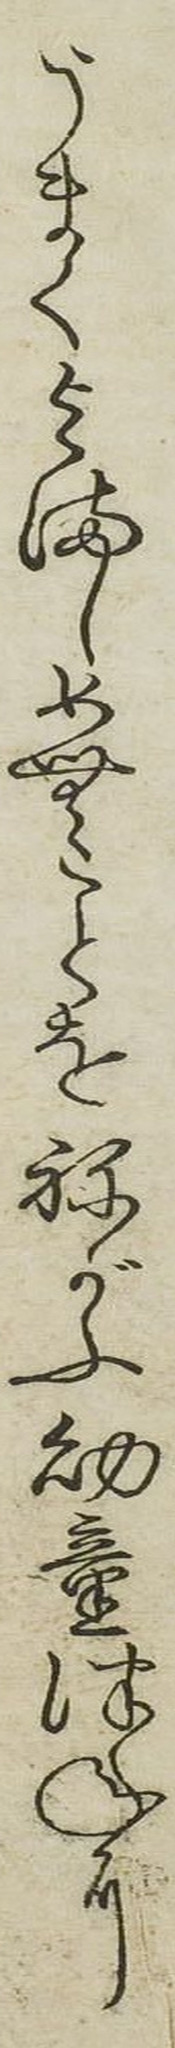うまくよましめむことをねがふ幼童つねに
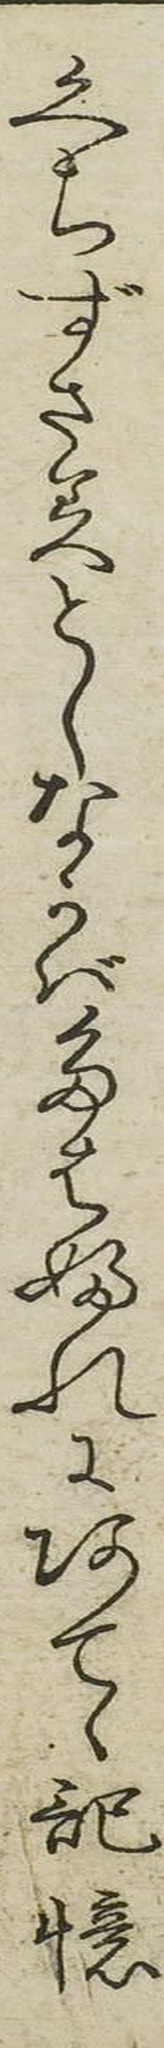くちずさみとしなかばたはふれにあてゝ記憶
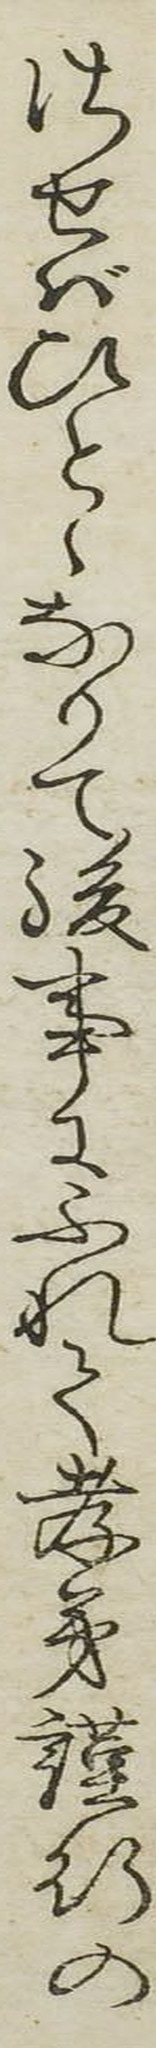させばひとゝなりて後事にふれて孝弟謹行の
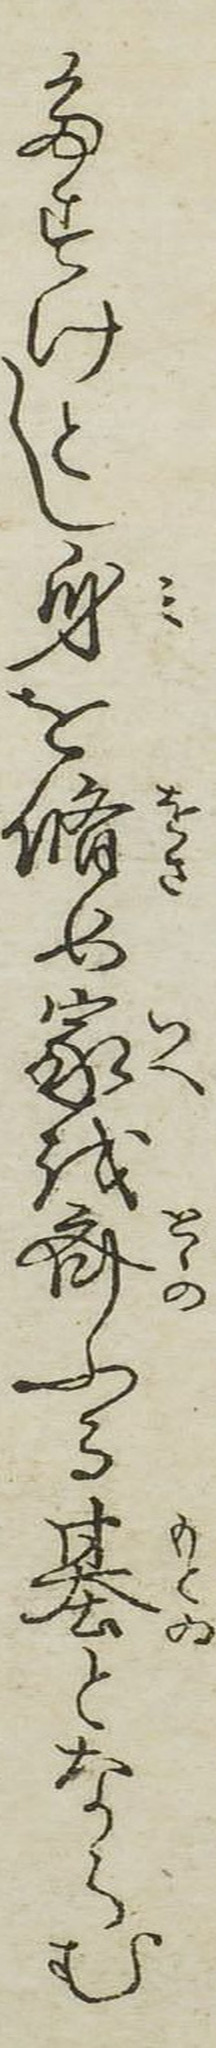たすけとし身を脩め家を斉ふる基とならむ
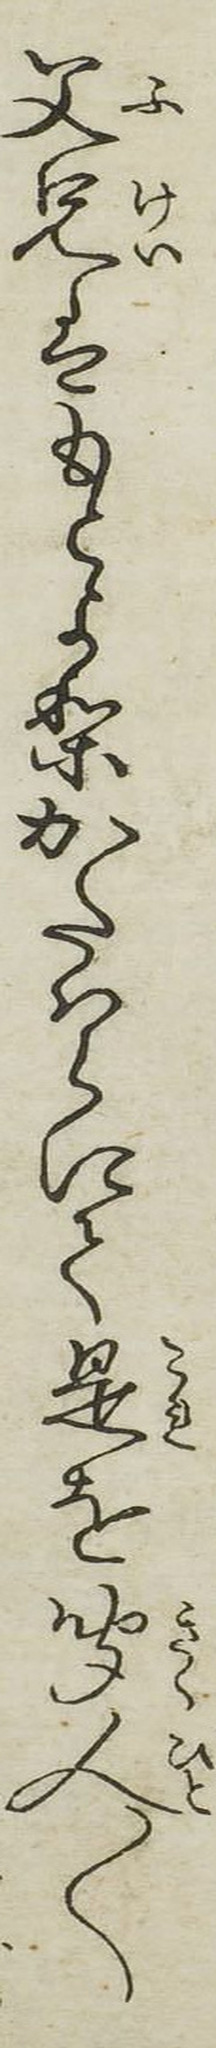父兄はもとよりかたはらにて是を聞人〳〵
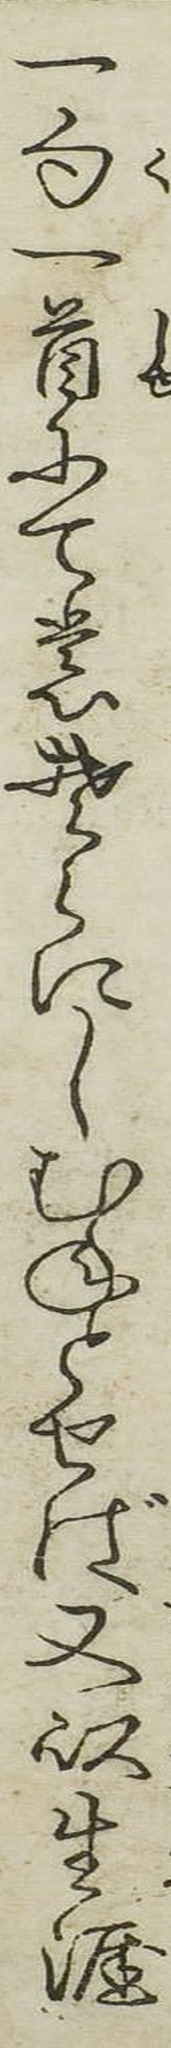一句一首にてもそらにしむねとせば又以生涯
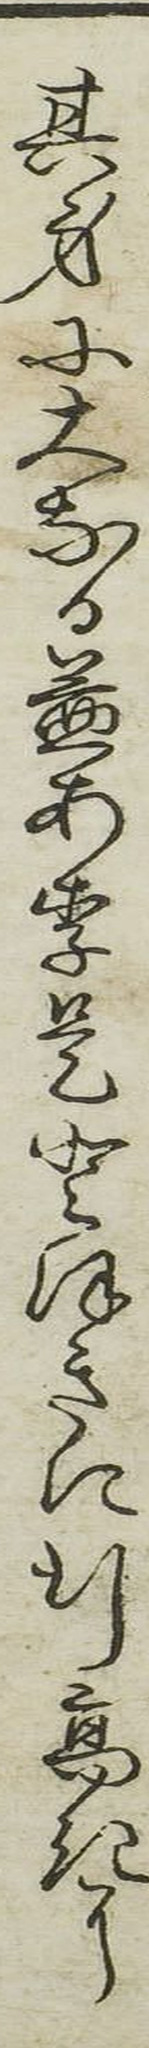其身に大なる益あり是とほきに行高きに
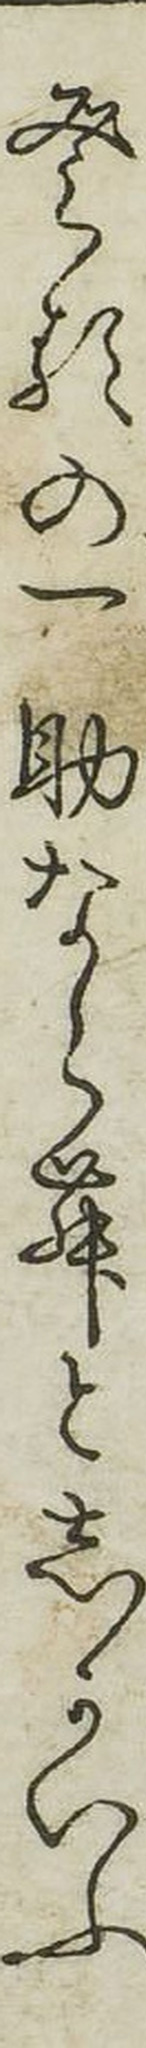登るの一助ならむとしかいふ
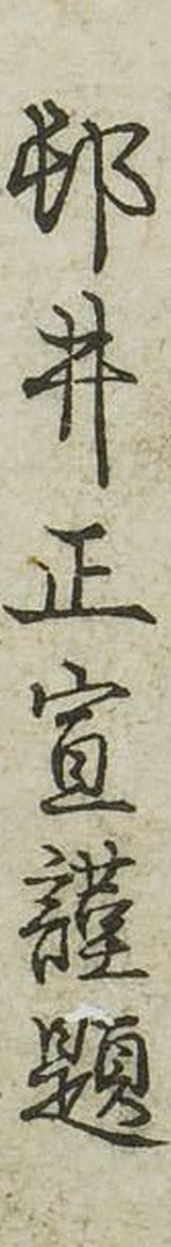邨井正宣謹題
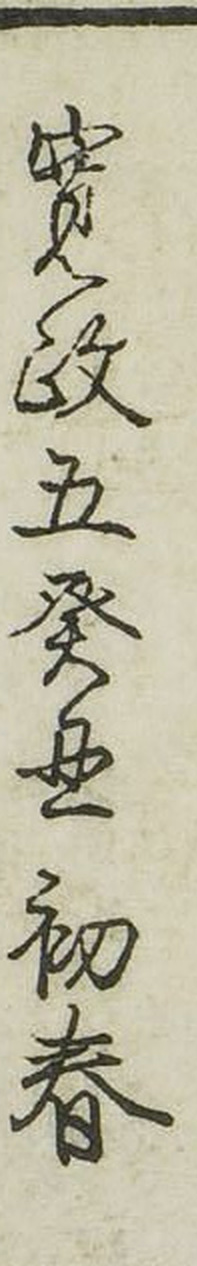寛政五癸丑初春
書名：五拾人一首
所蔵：東京学芸大学教育コンテンツアーカイブ
